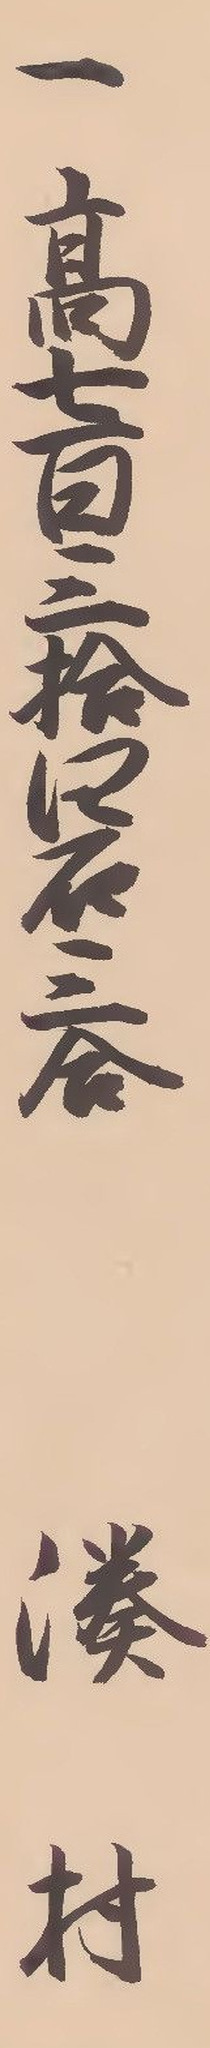一高七百三拾四石三合湊村

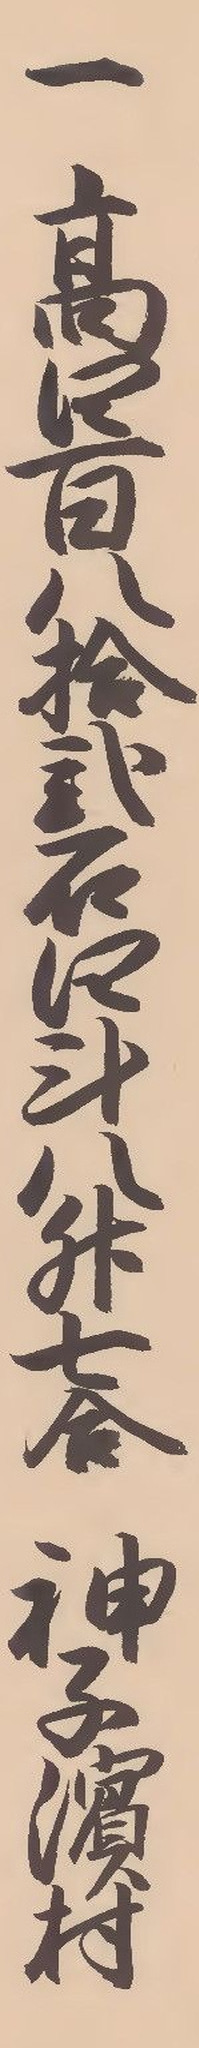一高四百八拾弐石四斗八升七合神子浜村
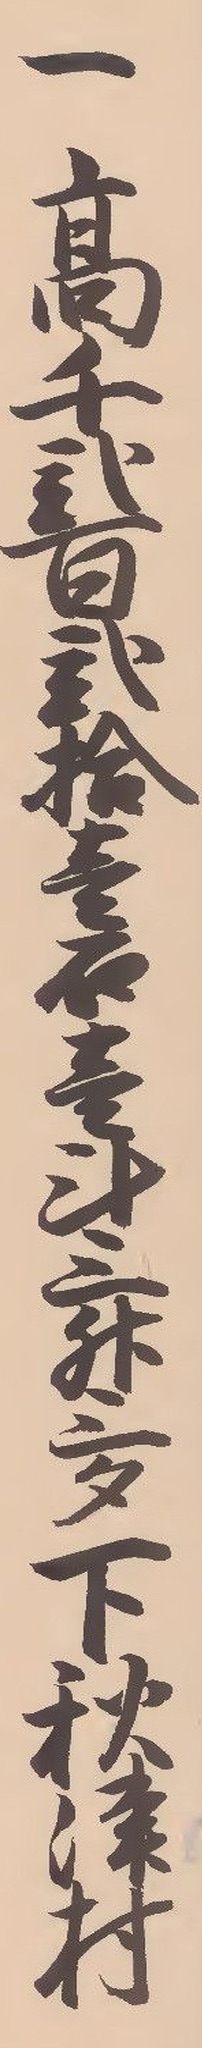一高千弐百弐拾壱石壱斗三升三勺下秋津村
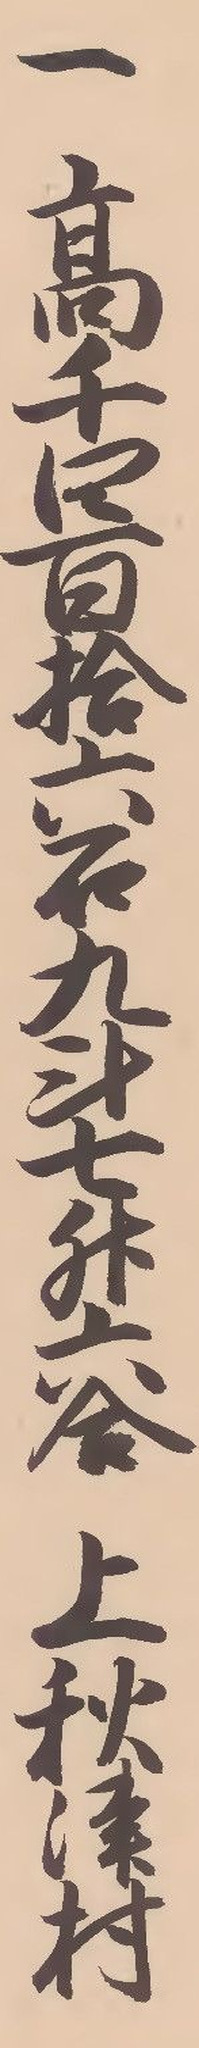一高千四百拾六石九斗七升六合上秋津村
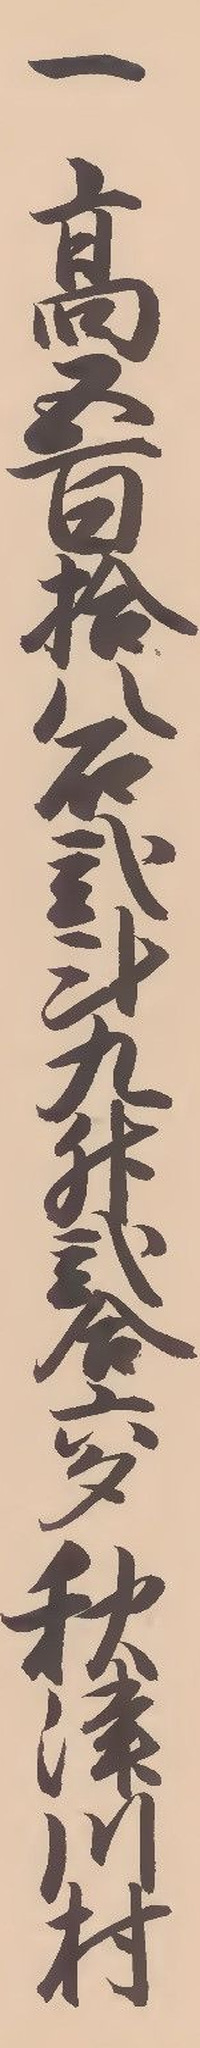一高五百拾八石弐斗九升弐合六勺秋津川村
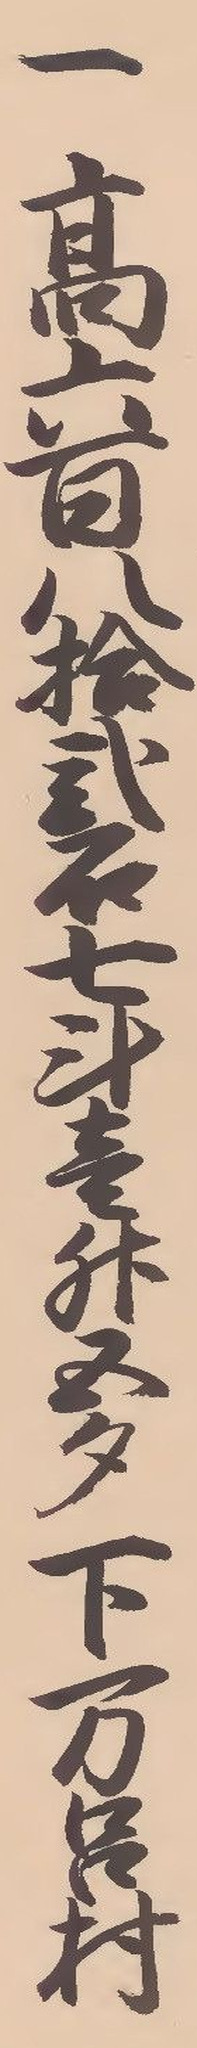一高六百八拾弐石七斗壱升五勺下万呂村

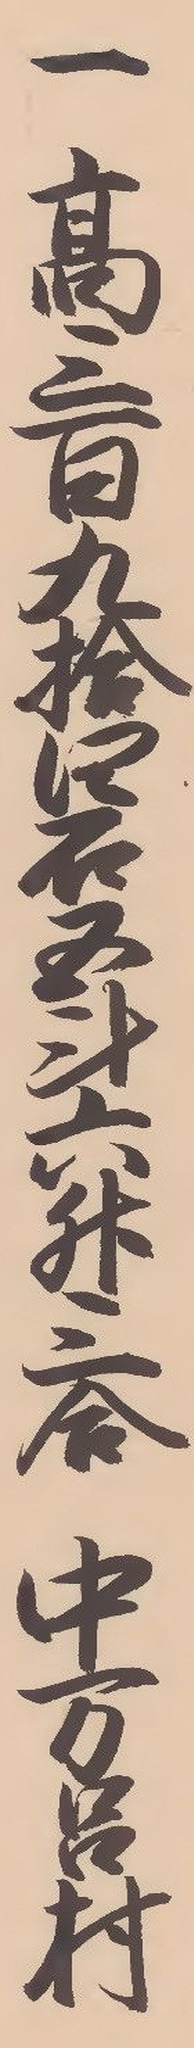一高三百九拾四石五斗六升三合中万呂村
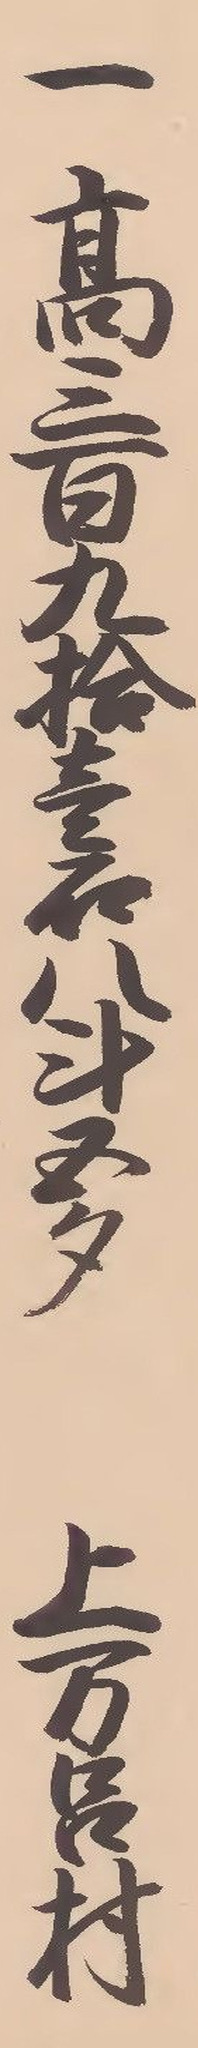一高三百九拾壱石八斗五勺上万呂村
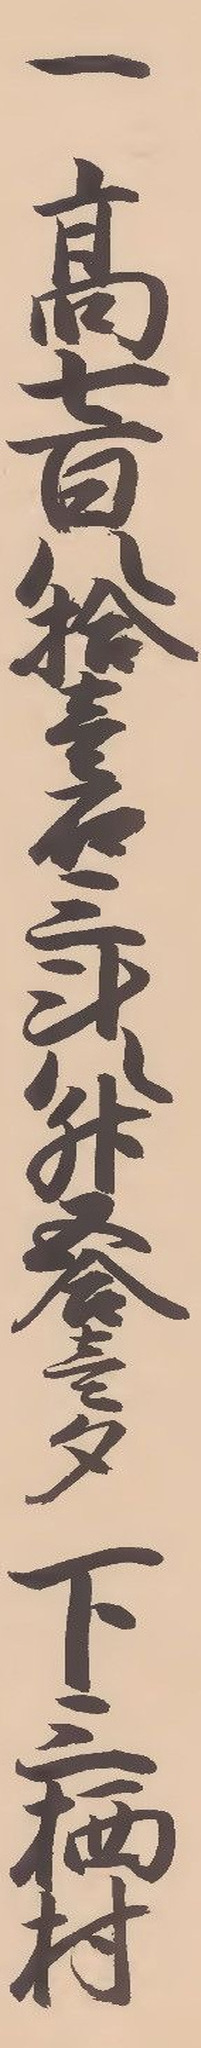一高七百八拾壱石三斗八升五合壱勺下三栖村
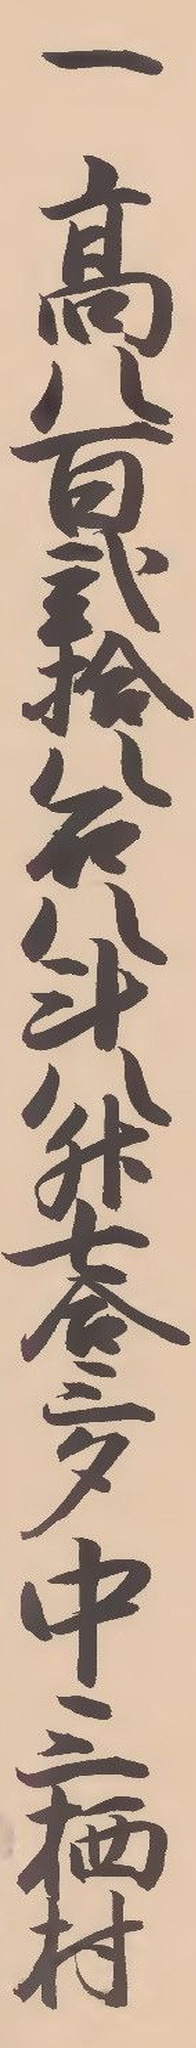一高八百弐拾八石八斗八升七合三勺中三栖村
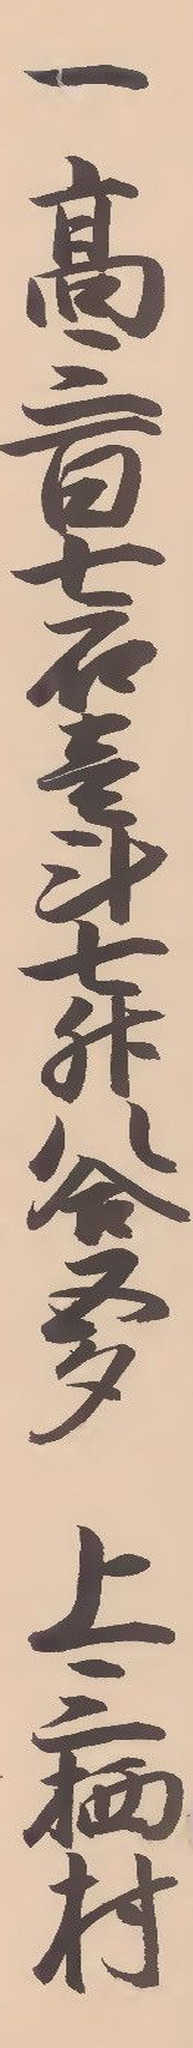一高三百七石壱斗七升八合五勺上三栖村
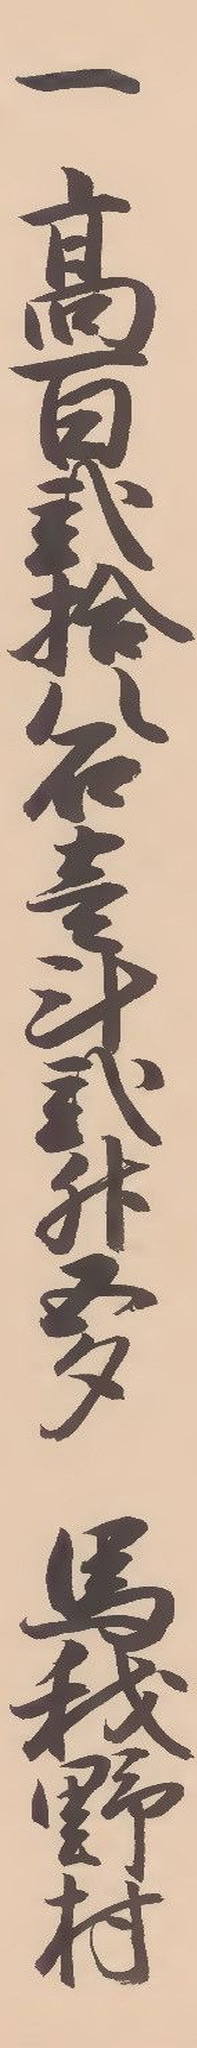一高百弐拾八石壱斗弐升五勺馬我野村
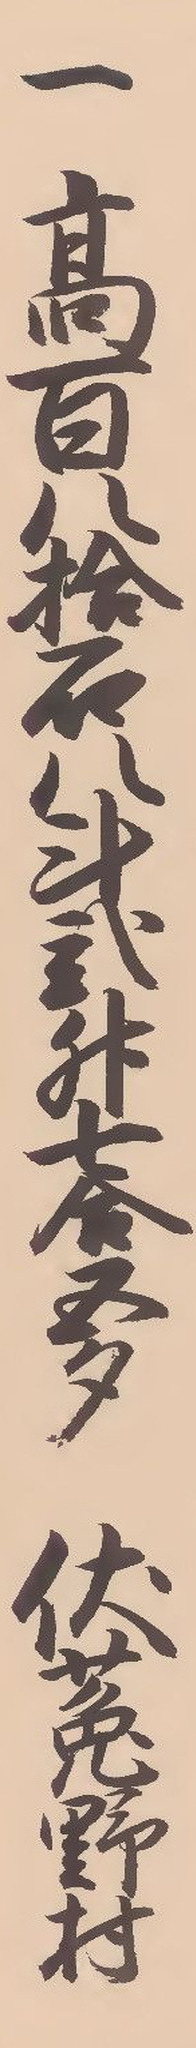一高百八拾石八斗弐升七合五勺伏菟野村

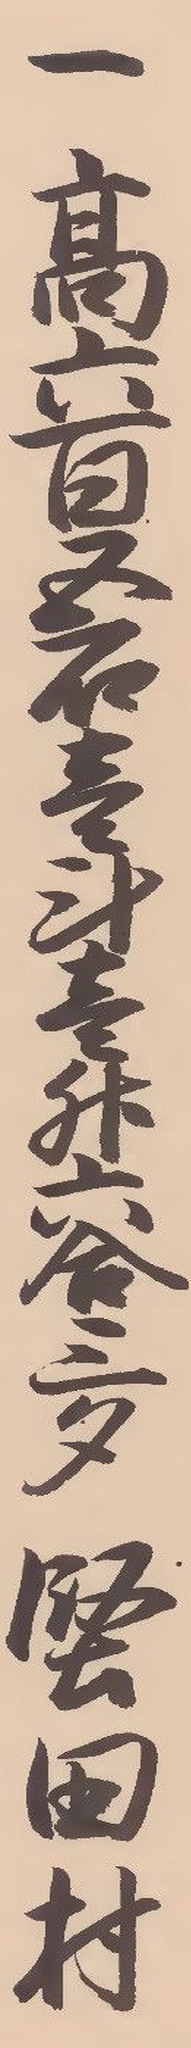一高六百五石壱斗壱升六合三勺堅田村
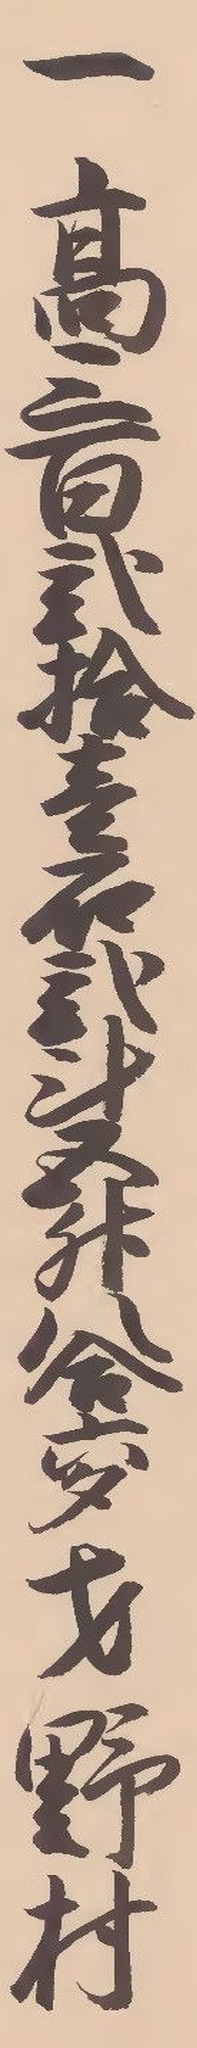一高三百弐拾壱石弐斗五升八合六勺才野村
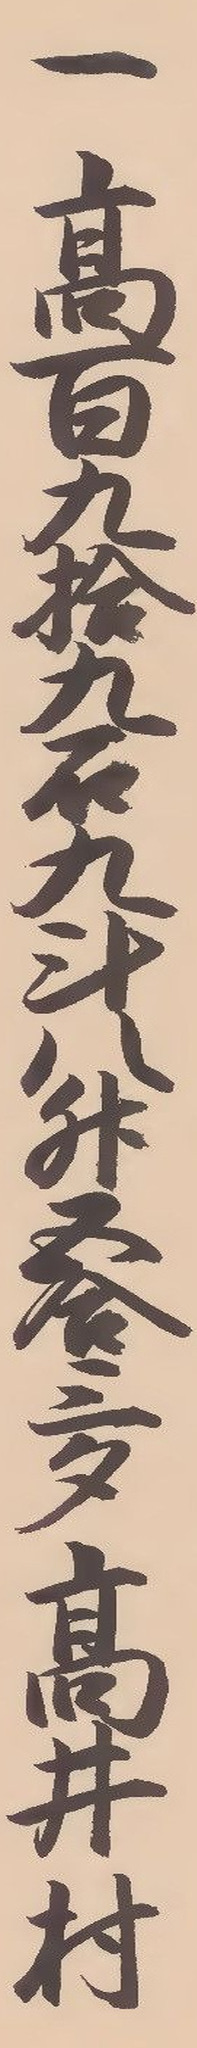一高百九拾九石九斗八升五合三勺高井村
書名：紀伊国郷帳
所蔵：国立公文書館 National Archives of Japan
